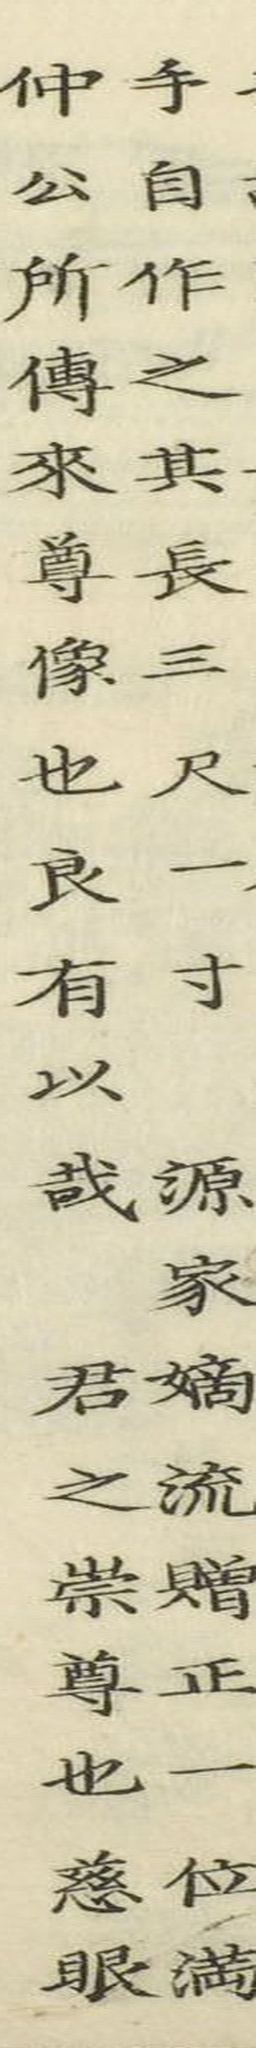仲公所傳來尊像也良有以哉君之崇尊也慈眼
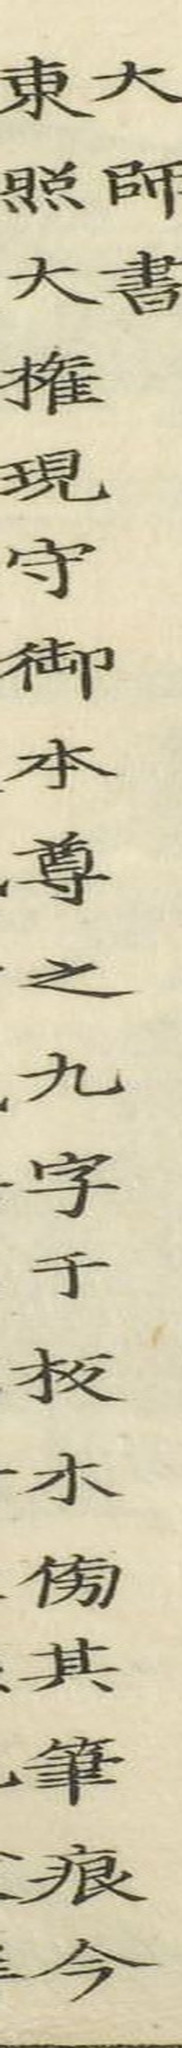東照大権現守御本尊之九字于板木𠊓其筆痕今
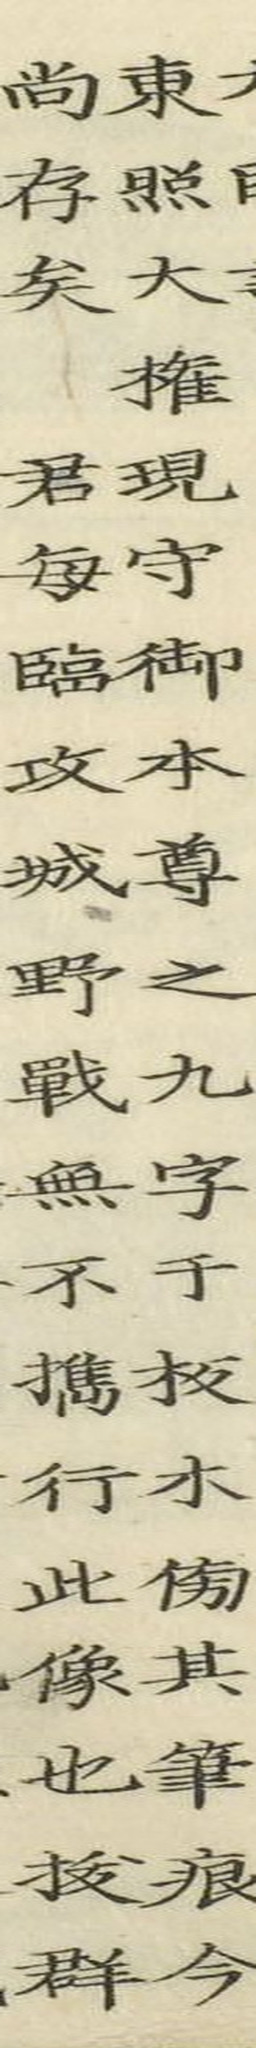尚存矣君毎臨攻城野戰無不擕行此像也㧞群
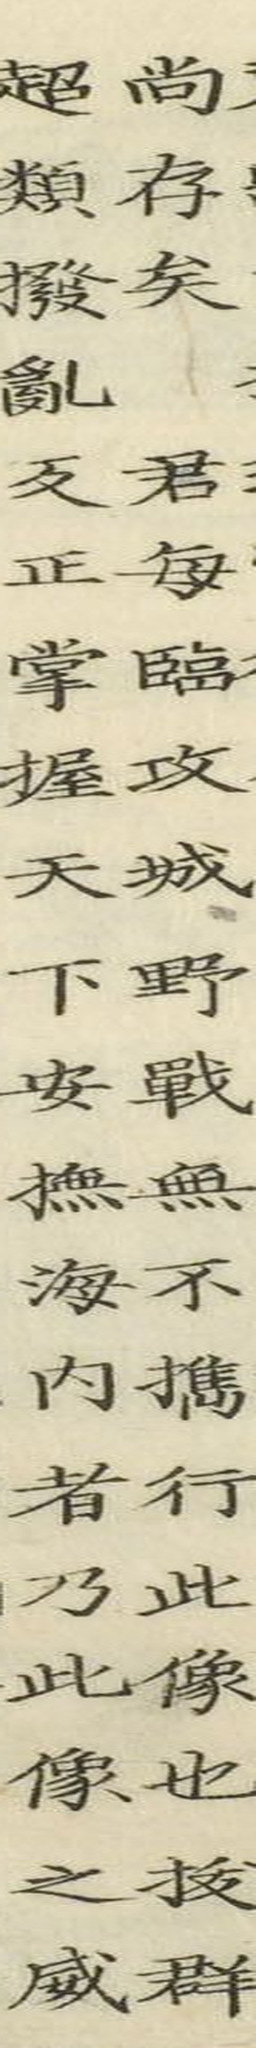超類撥亂反正掌握天下安撫海内者乃此像之威
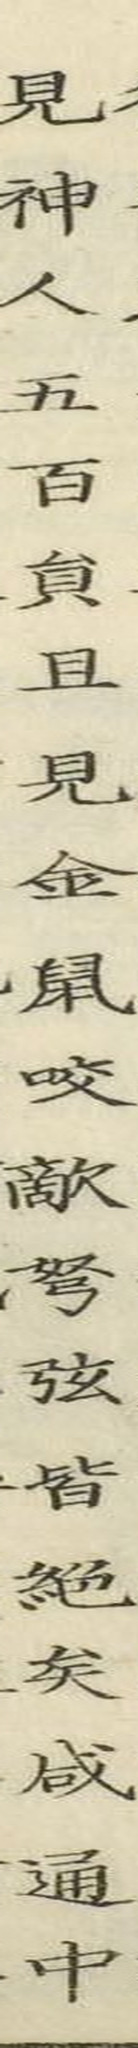見神人五百員且見金鼠咬歒弩弦皆絶矣咸通中
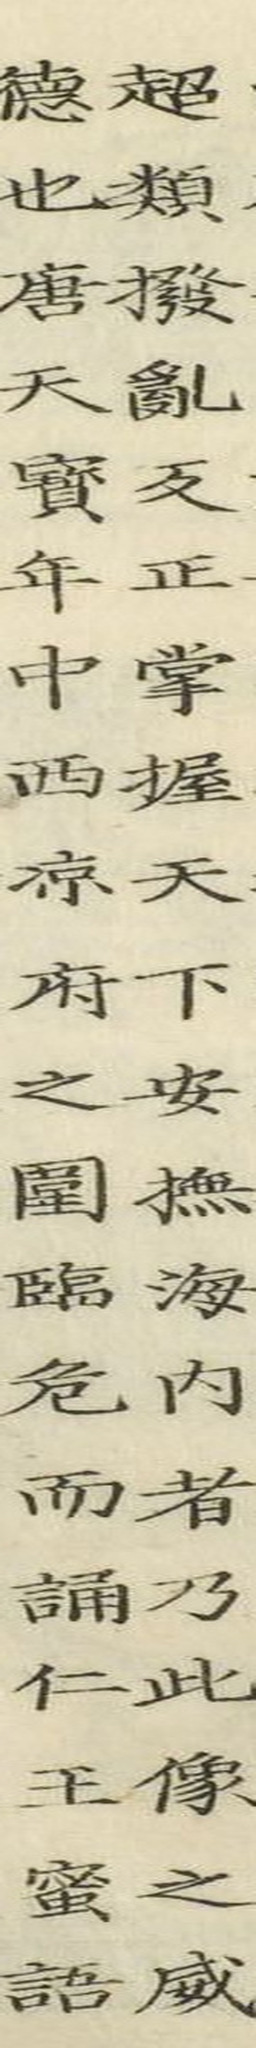德也唐天寳年中西凉府之圍臨危而誦仁王蜜語
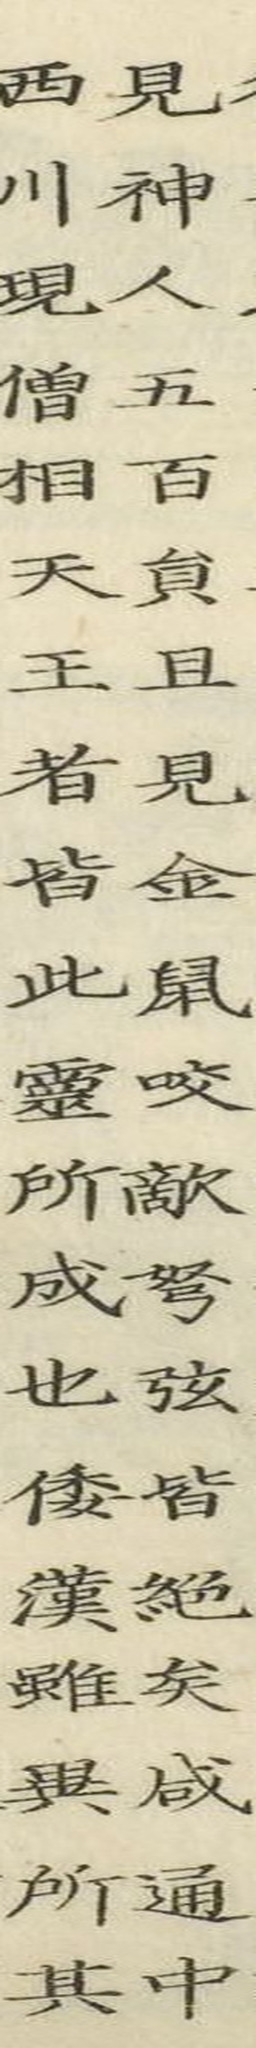西川現僧相天王者皆此靈所成也倭漢雖異所其
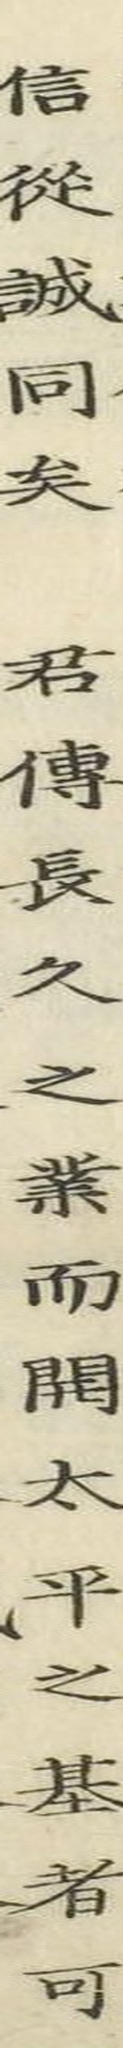信從誠同矣君傳長久之業而開太平之基者可
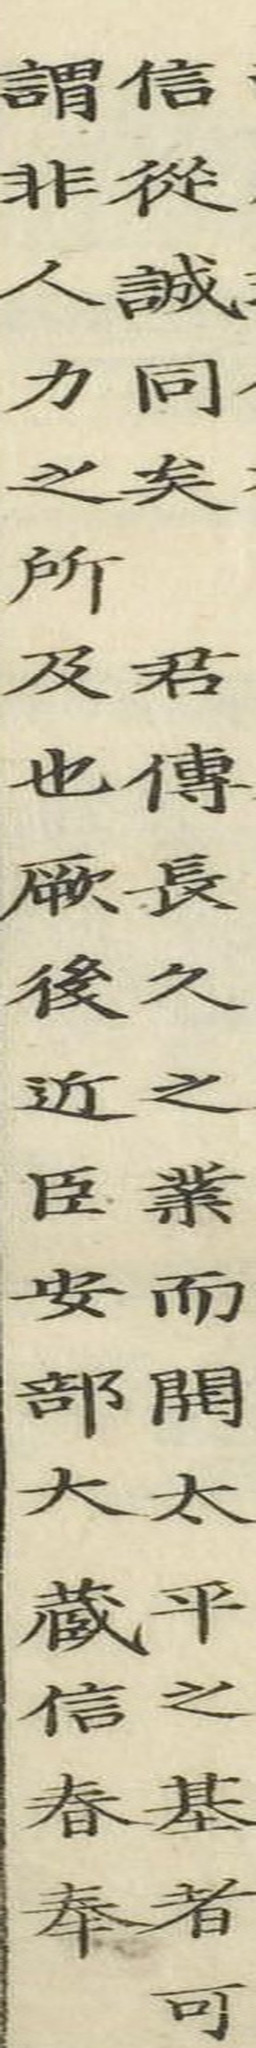謂非人力之所及也厥後近臣安部大蔵信春奉
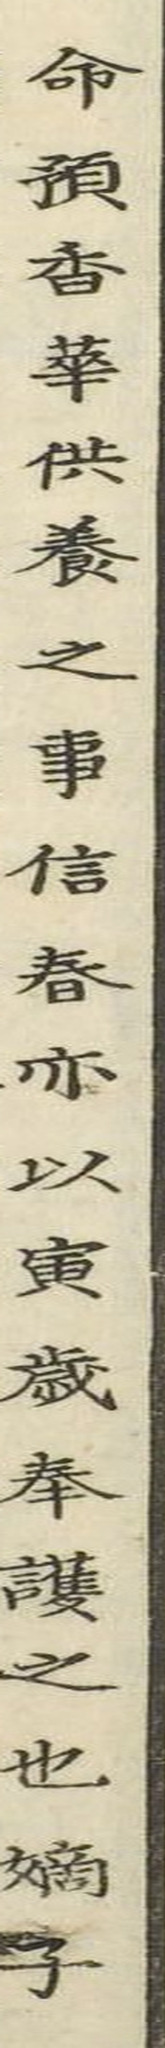命預香華供養之事信春亦以寅歳奉護之也嫡子
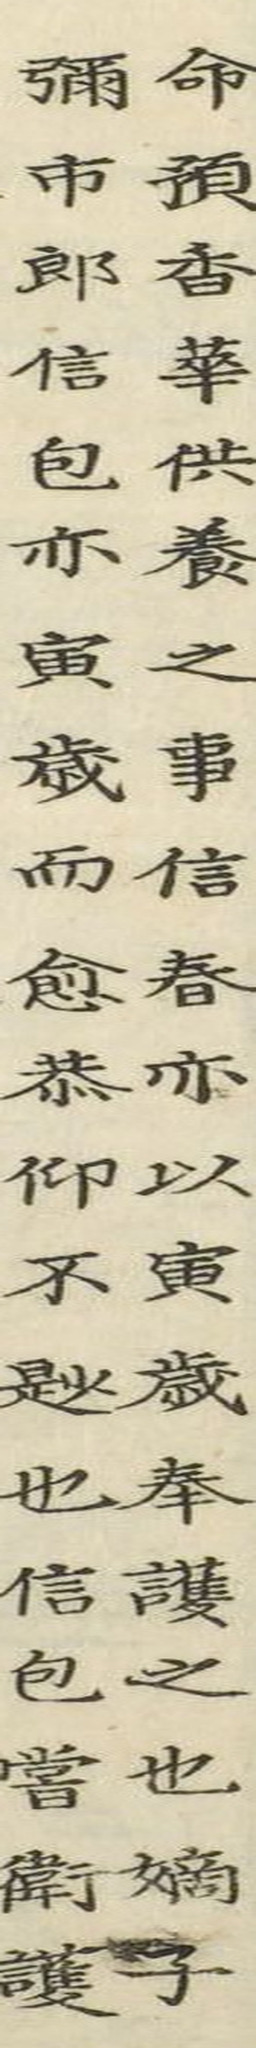彌市郎信包亦寅歳而愈恭仰不尟也信包嘗衛護
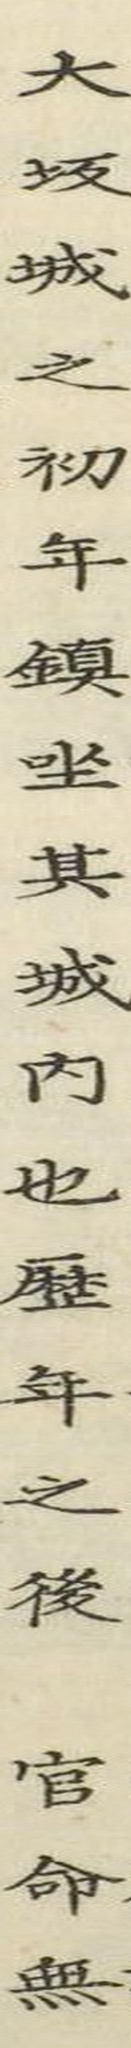大坂城之初年鎮㘴其城内也歴年之後官命無
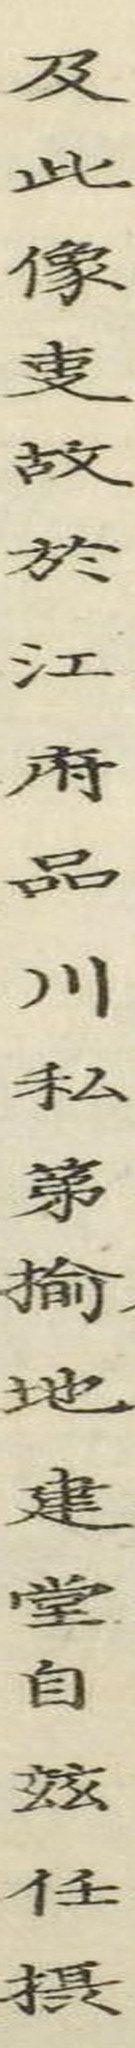及此像㕝故於江府品川私第揄地建堂自玆任摂
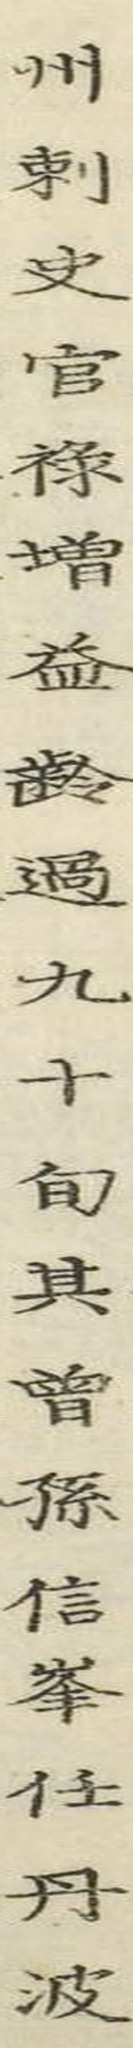州刺史官禄増益齢過九十旬其曽孫信峯任丹波
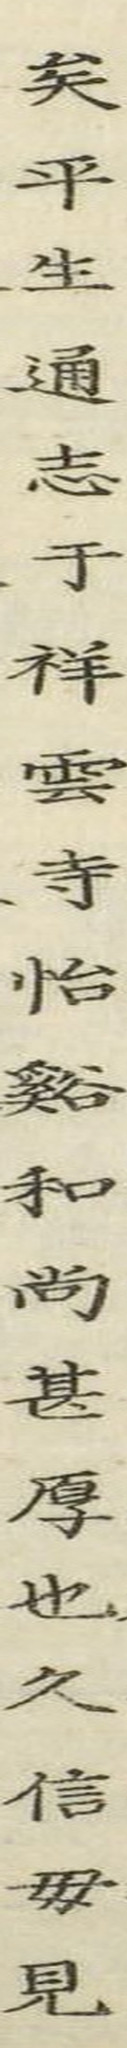矣平生通志于祥雲寺怡谿和尚甚厚也久信母見
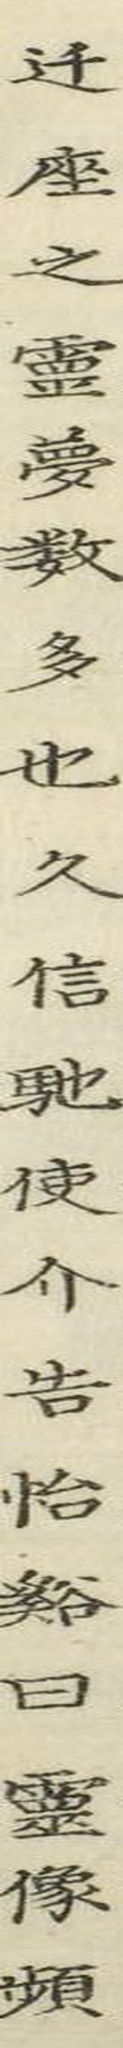迁座之靈夢数多也久信馳使介告怡谿曰靈像頻
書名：江戸名所図会 20巻 巻之7
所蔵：東京学芸大学教育コンテンツアーカイブ
